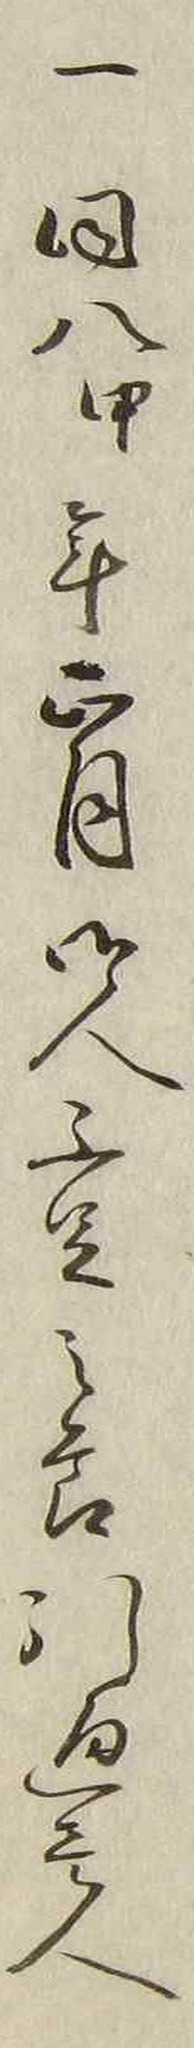一同八申年正月御人不足之節引通壱人
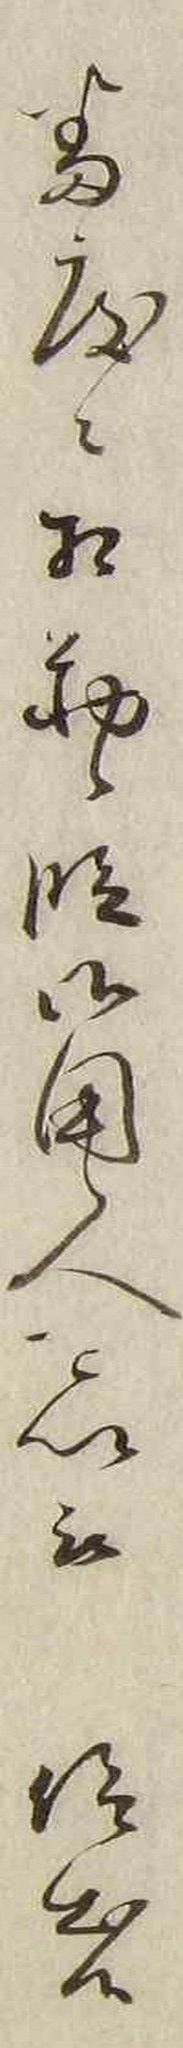番度々相勤候段御用人を以被仰出候

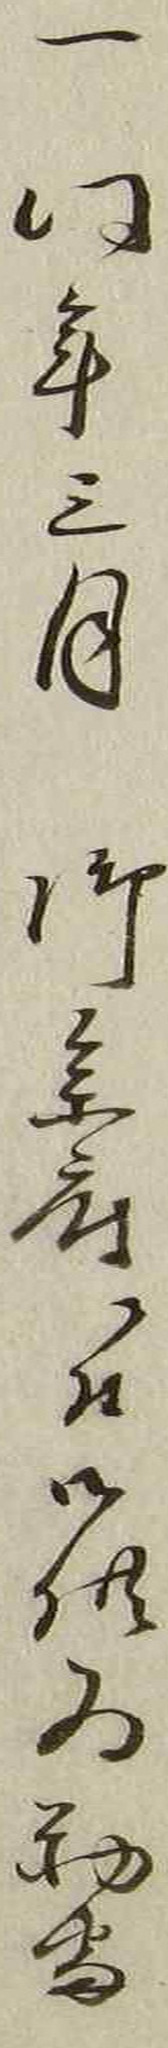一同年三月御参府ニ付御供為勤番
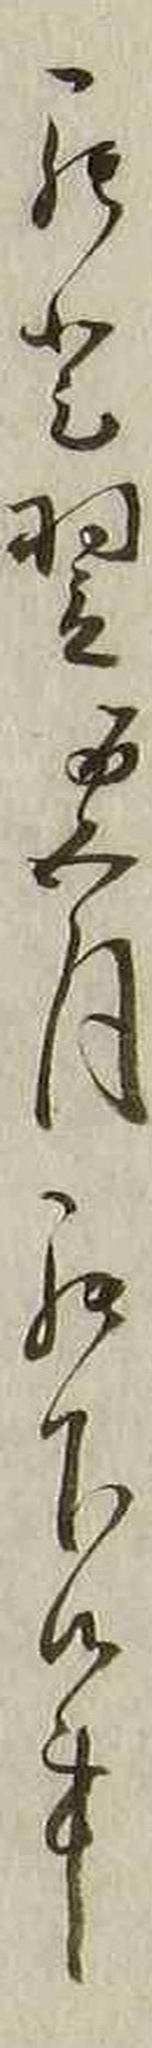罷登翌丑五月罷下候事
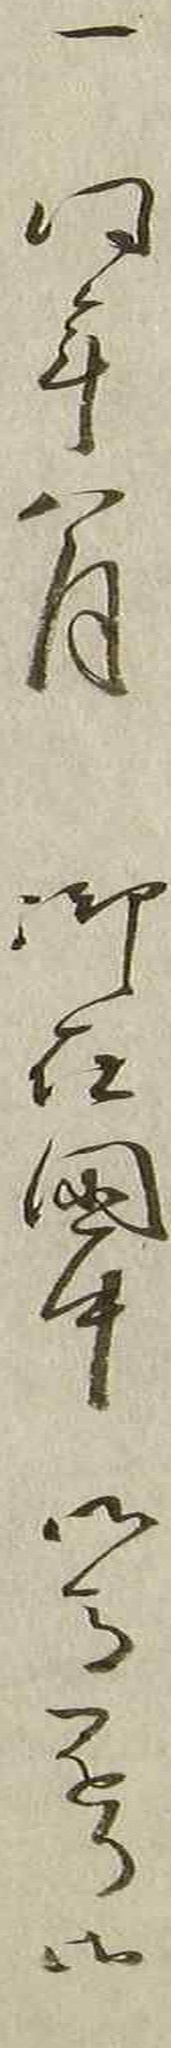一同年八月御在国中御馬懸り御
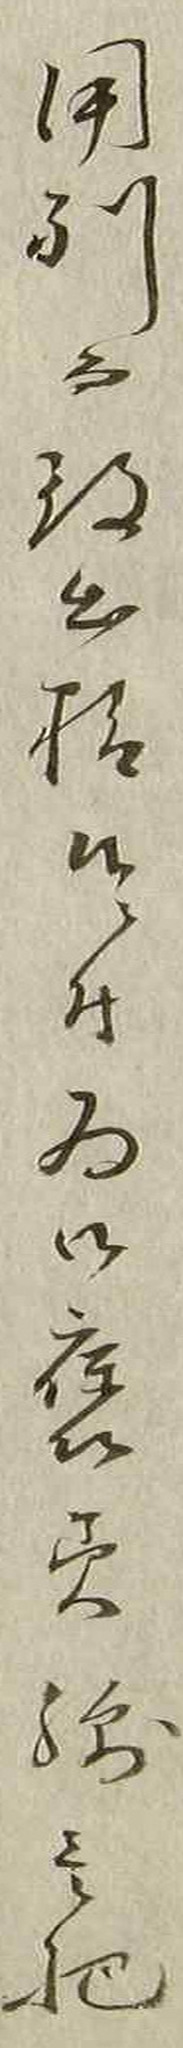用別而致出精候ニ付為御褒美綿壱把
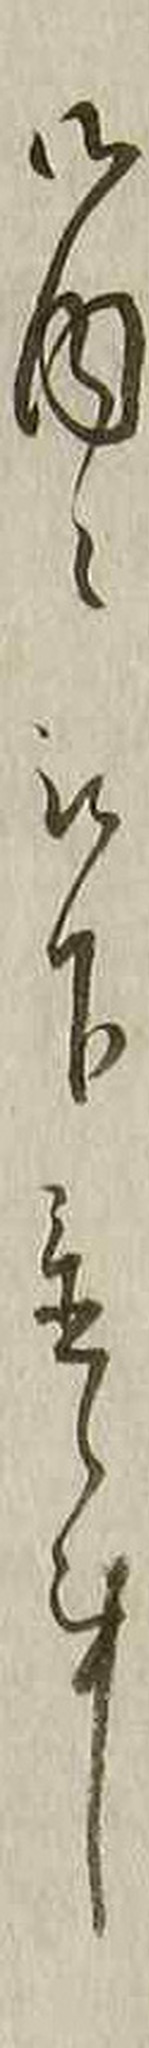御内々被下置候事
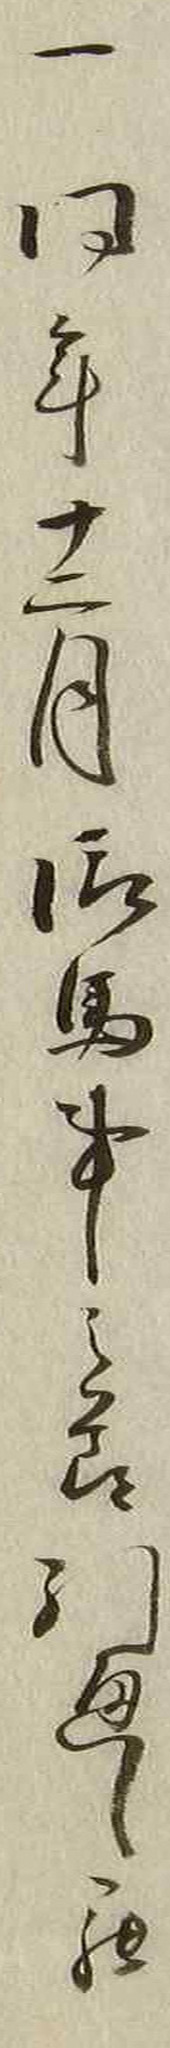一同年十二月御馬事之節引通し罷
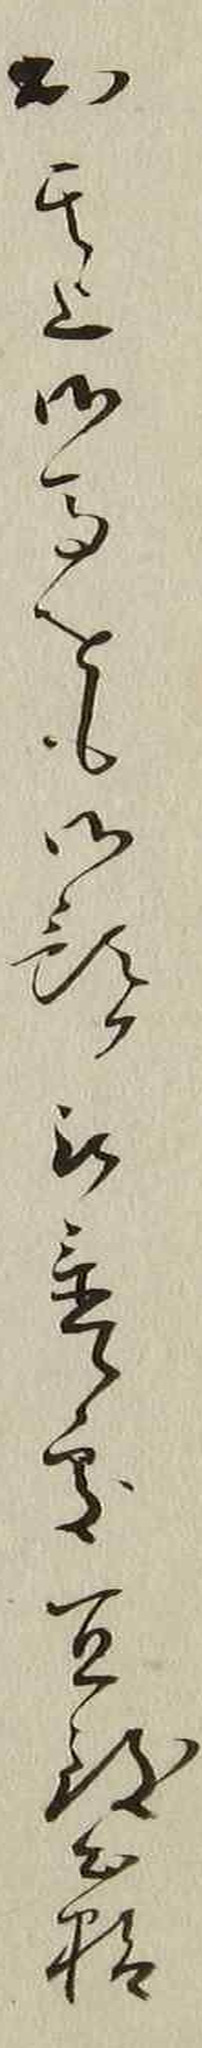出其上御馬をも御預ケ被置候処宜致出精
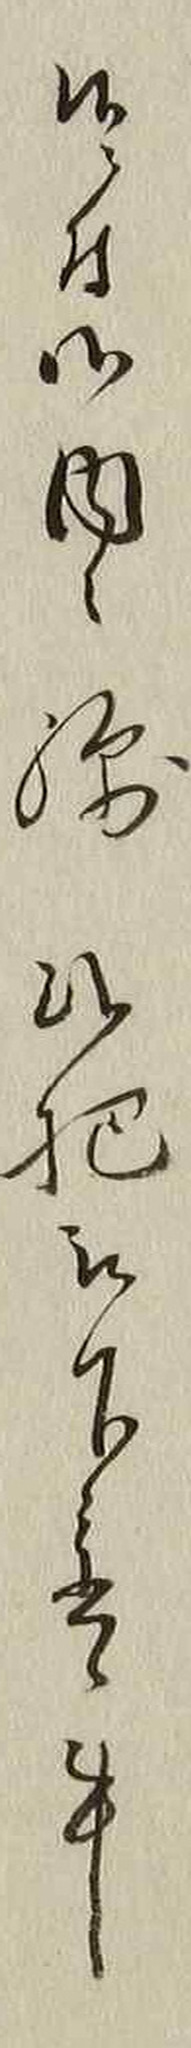候ニ付御内々綿弐把被下置候事
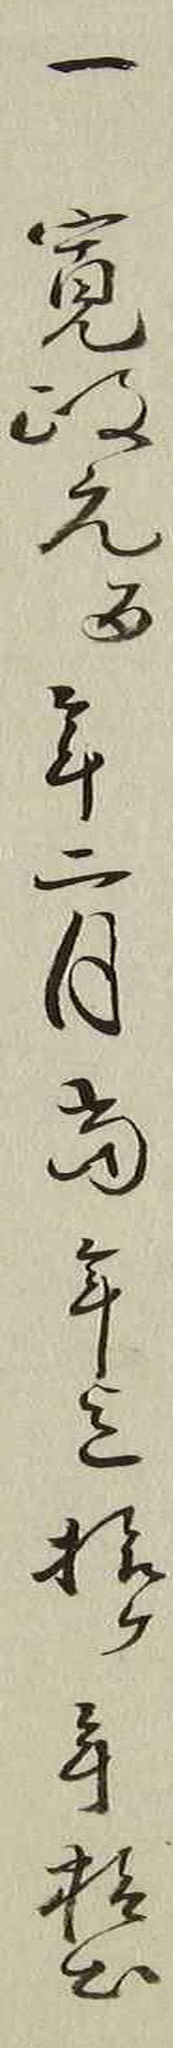一寛政元酉年二月当年迄拾ケ年精出
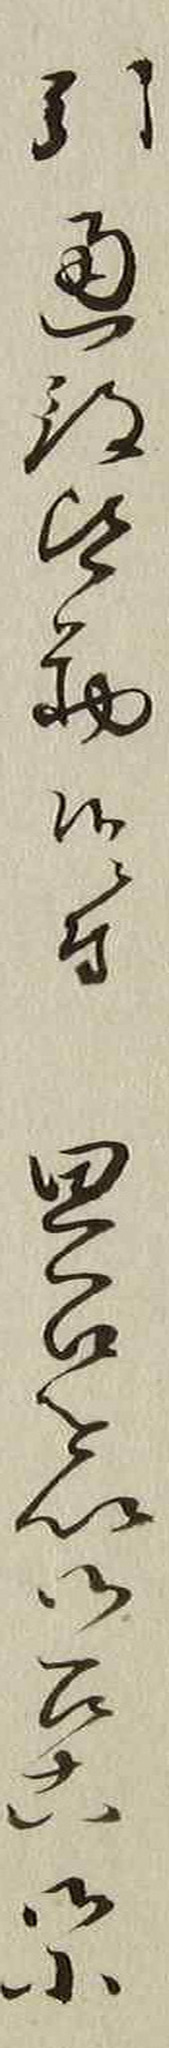引通致皆勤候ニ付思召を以御召古御小
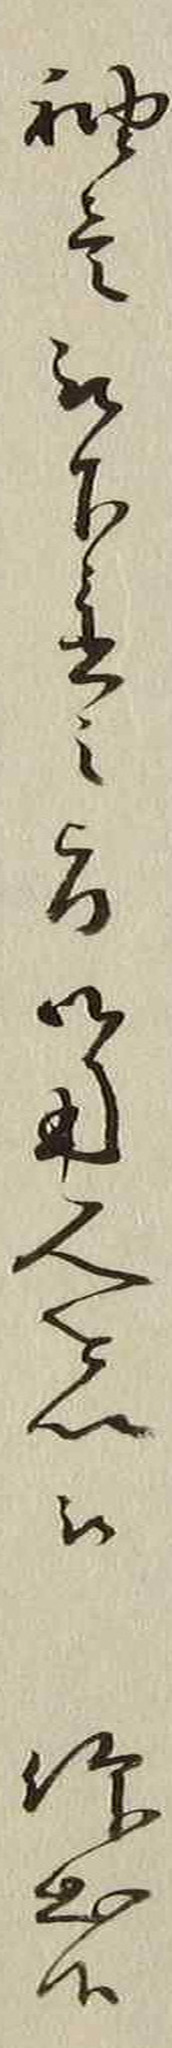袖壱被下置之旨御用人を以被仰出候
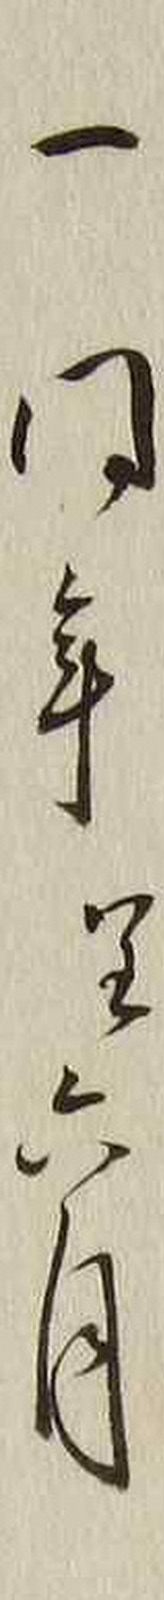一同年閏六月
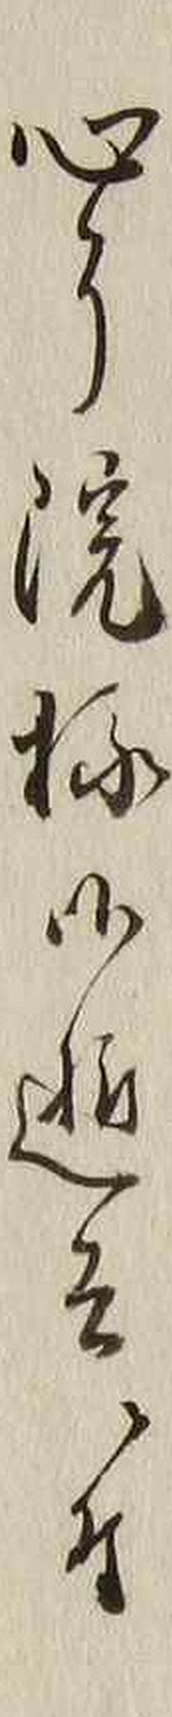心了院様御逝去ニ付
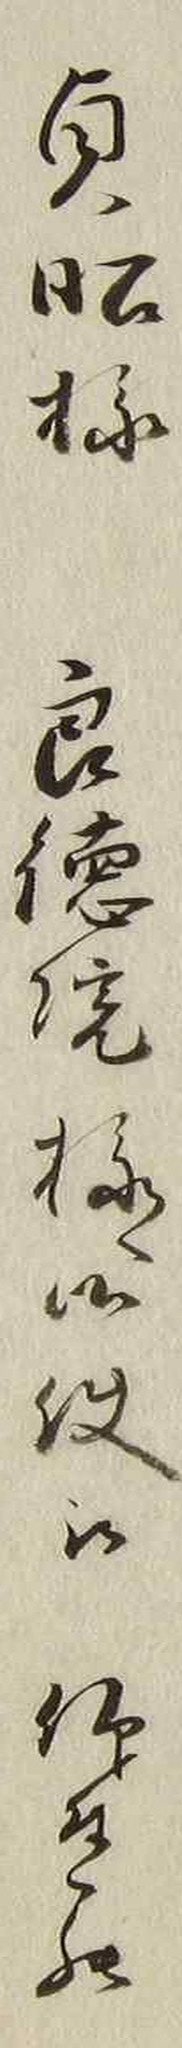貞昭様良徳院様へ御使被仰付罷
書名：諸士系譜　巻之25　い之部25
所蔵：会津若松市立会津図書館
